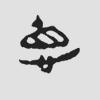德
